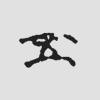五
